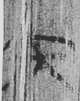內（入）
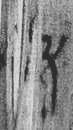夂（終）
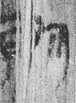則
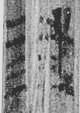或（又）
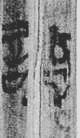○（始）
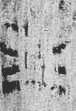至
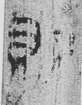則
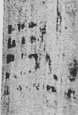或（又）
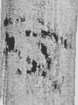反
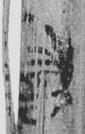○（察）
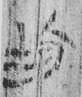此
